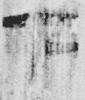下
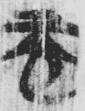而
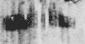一
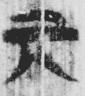亓（其）
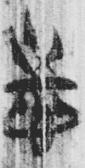志
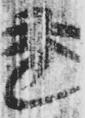而
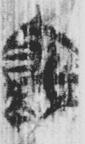寢
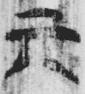亓（其）
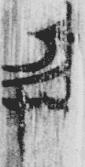兵
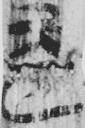而
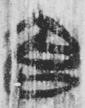官
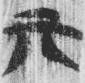亓（其）
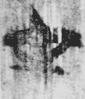才（材）
